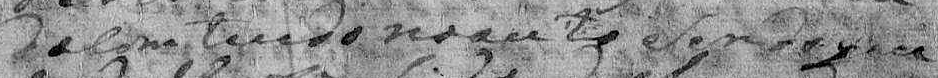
do comteudo no auto sendo qua
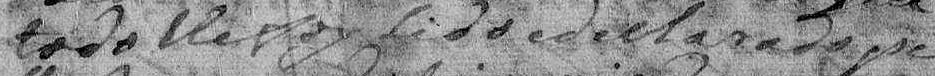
todo lhe foy Lido e declarado pe
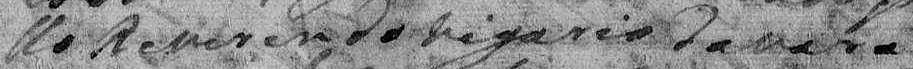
llo Reverendo vigario da vara
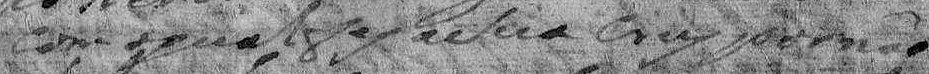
com o qual fes a sua crus por naõ
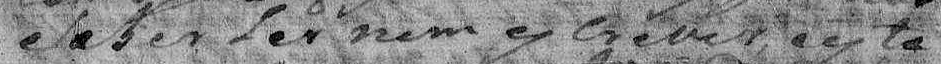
saber Ler nem escrever, e esta
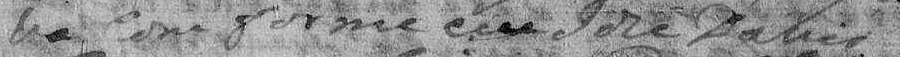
va comforme eu Joze David
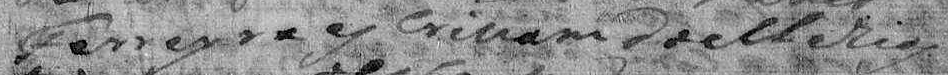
Ferreyra escriuam do eclezias
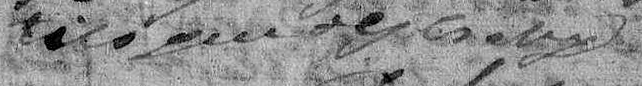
tico que o escrevy
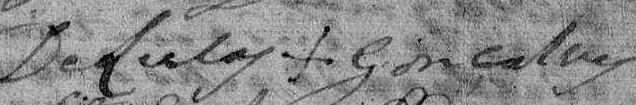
De Lucas + Gonçalves
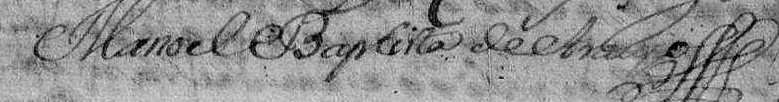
Manoel Baptista de Araujo
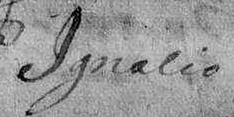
Ignacio
